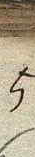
5
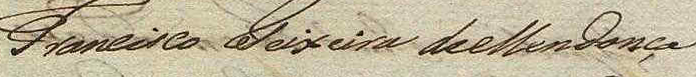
Francisco Teixeira de Mendonça
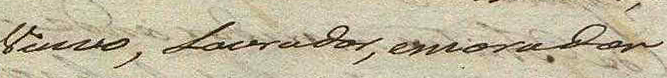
Viuvo, lavrador, e morador
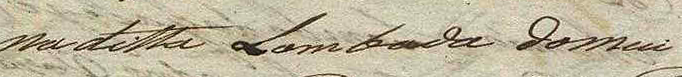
na dita Lombada do mui
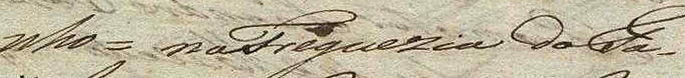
nho = na Freguezia do Fa
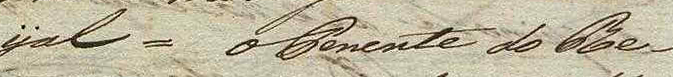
yal = o Tenente do Re
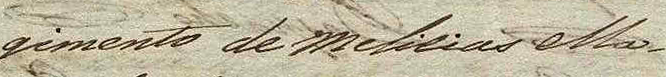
gimento de melicias Ma
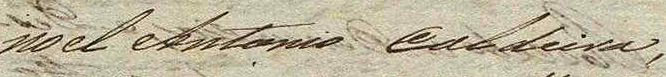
noel Antonio caldeira,
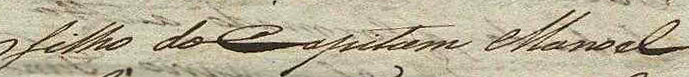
filho do Capitam Manoel
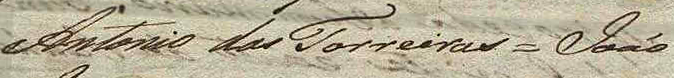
Antonio das Torreiras = Ioaõ
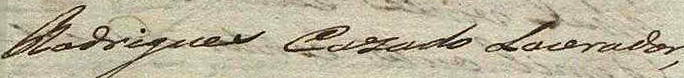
Rodrigues cazado lavrador,
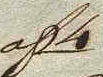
a f10
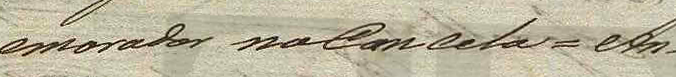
e morador na Cancela = An
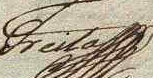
Freita
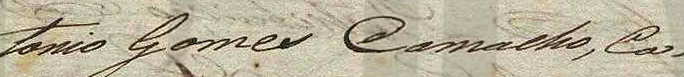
tonio Gomes Camacho, Ca
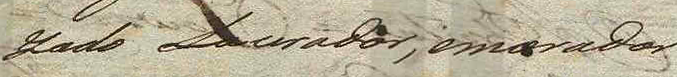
zado Laurador, e morador
